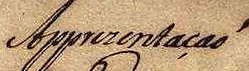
Apprezentaçaõ
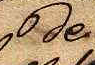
de
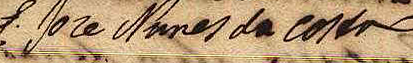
E. Joze Nunes da costa
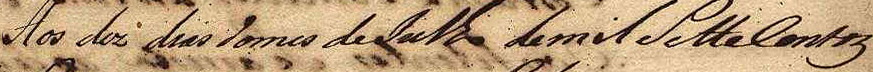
Aos dez dias do mes de Iulho de mil SetteCentoz
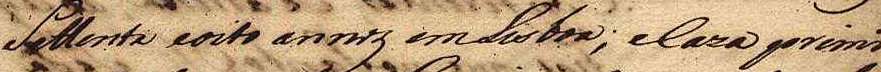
Settenta e oito annoz em Lisboa; e Caza primra
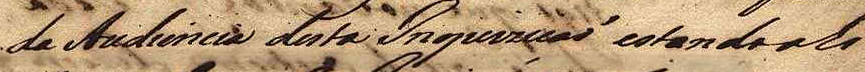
da Audiencia desta Inquiziçaõ estando ahi
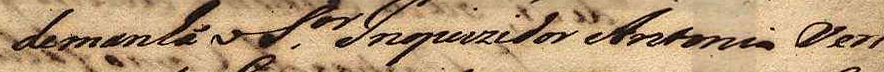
de manhã o S.or Inquizidor Antonio Veri
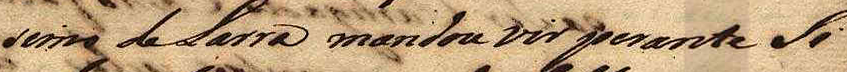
simo de Larra mandou vir perante Si
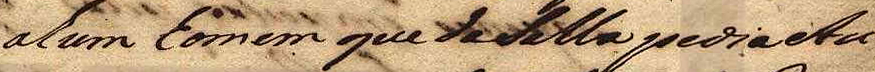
a hum homem que da Sella pedia Au
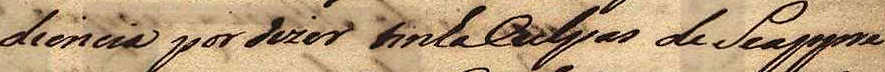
diencia por dizer tinha culpas de Se appre
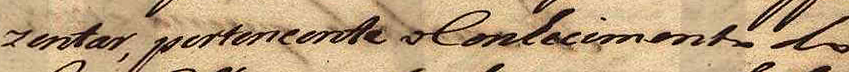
zentar, pertencente o Conhecimento do
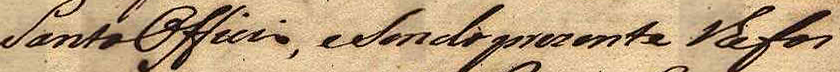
Santo Officio, e Sendo prezente lhe foi
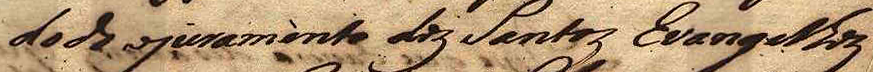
dado o juramento doz Santoz Evangelhoz
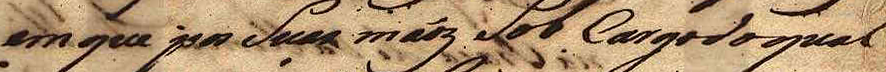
em que pos Suas maõz Sob Cargo do qual
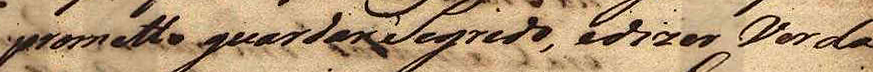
promette guardar Segredo, e dizer Verda
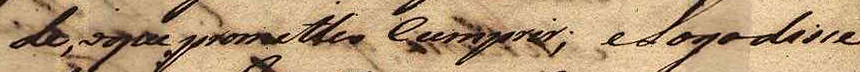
de, o que prometteo cumprir; e Logo disse
